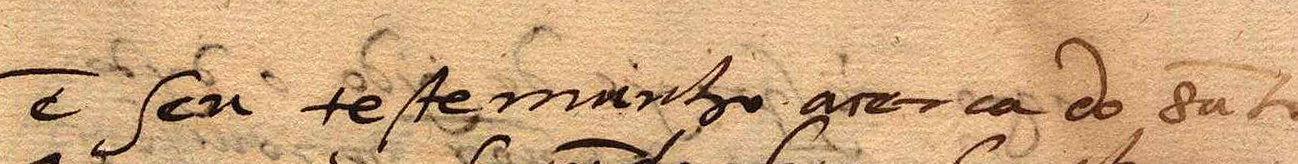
ē seu testemunho acerca do sāto
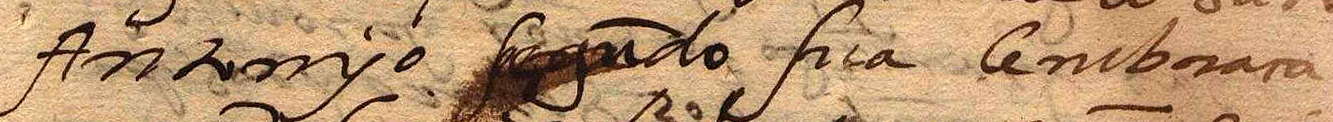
Antonyo segūdo sua lembraça
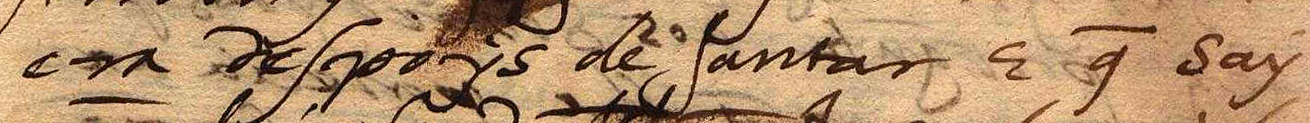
era despoys de Jantar E q̄ say
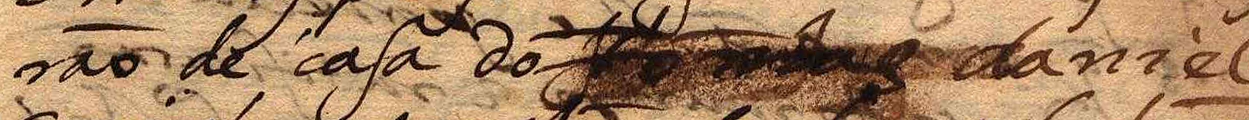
rão de casa do thomas daniel
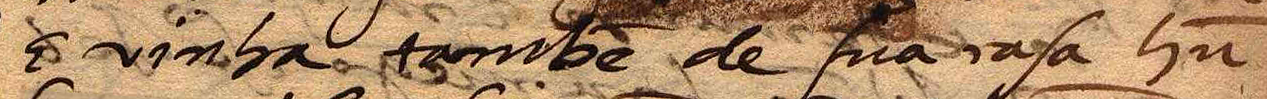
E vinha tambē de sua casa hū
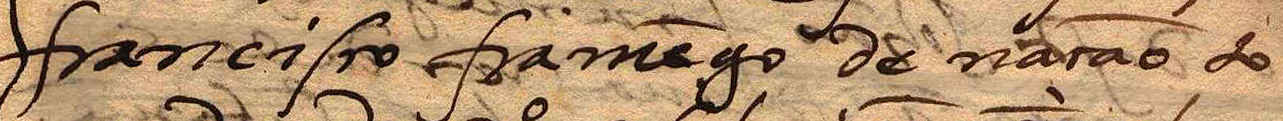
francisco framēgo de nação to
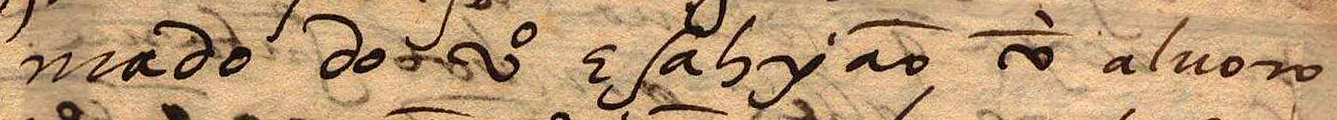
mado do vo E sahyão cō aluoro
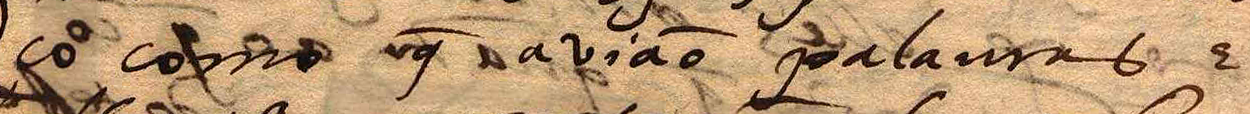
ço como q̄ aviaõ palauras E
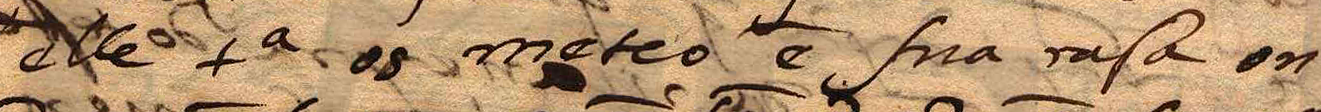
elle ta os meteo ē sua casa on
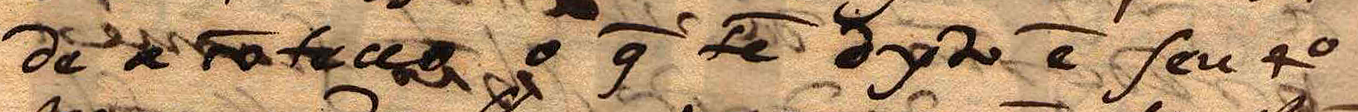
de acōteceo o q̄ tē dyto ē seu to
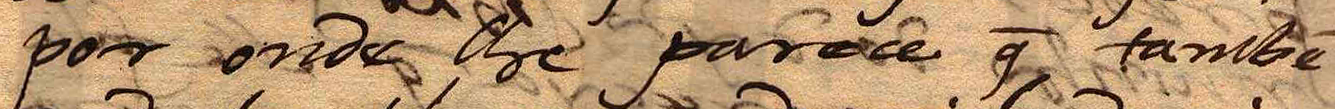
por onde lhe parece q̄ tambē
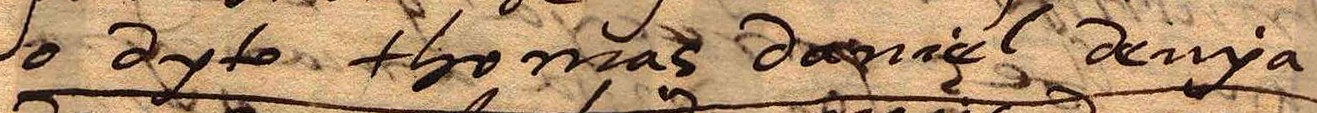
o dyto thomas daniel deuya
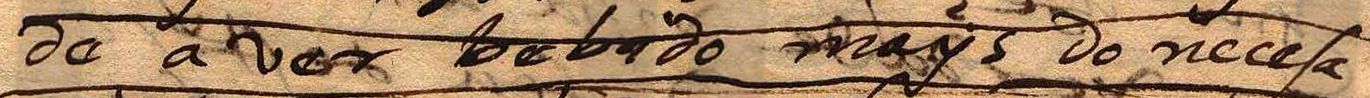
de aver bebido mays do necesa
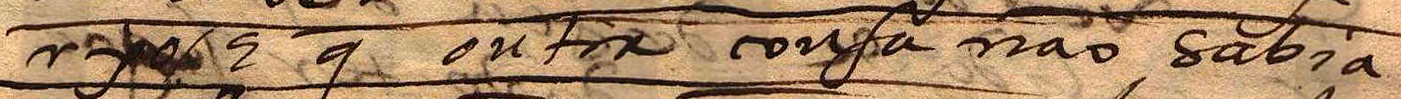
ryo / E q̄ outra cousa não sabia
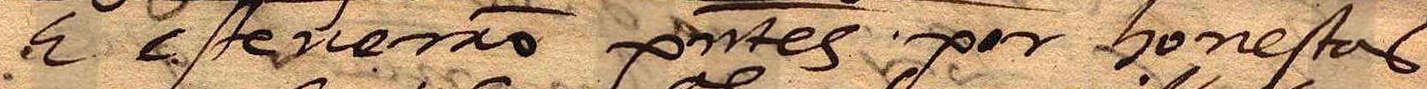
E esteueraõ pn̄tes por honestas
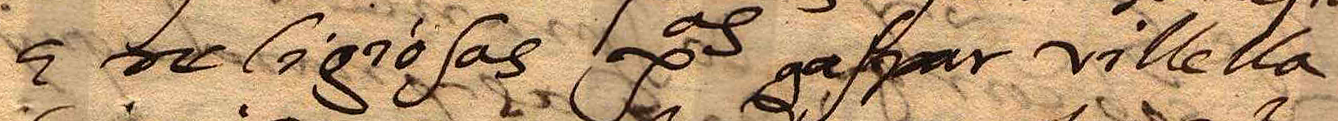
E religiosas pas gaspar villella
